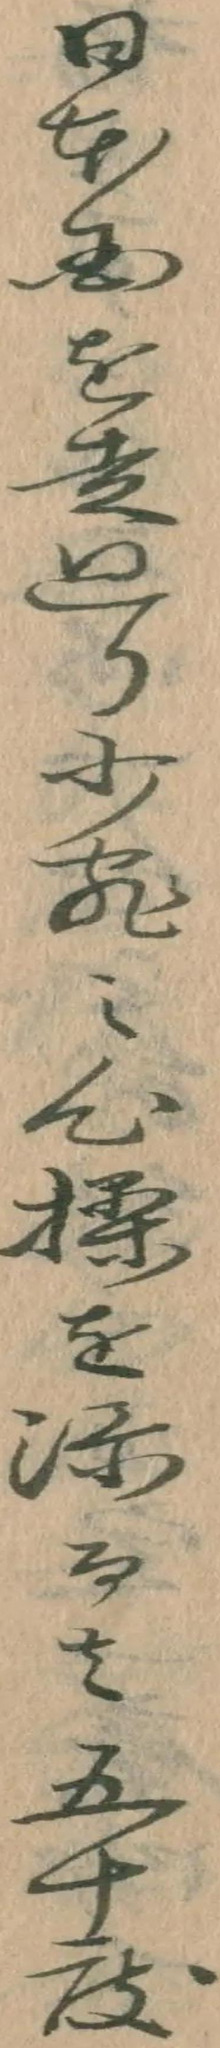日本国を責廻り少究之心操を添而者五十度
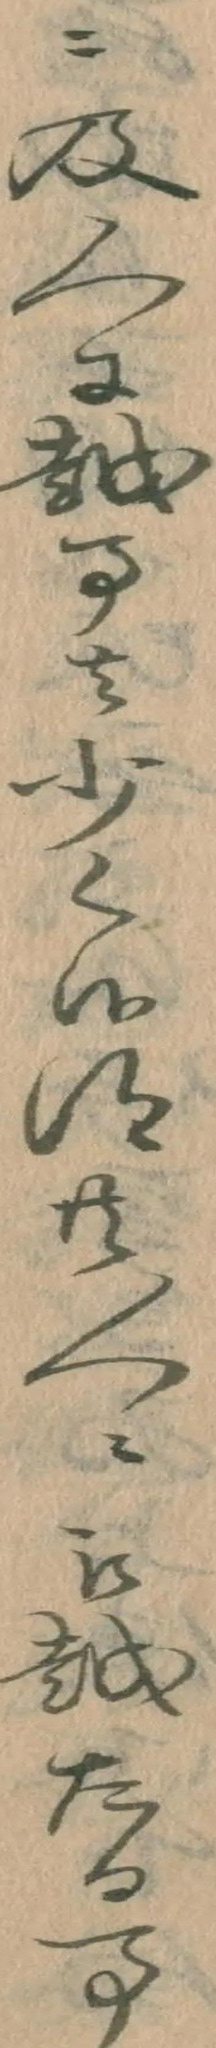に及人尓越事者少く候得共人に被越たる事
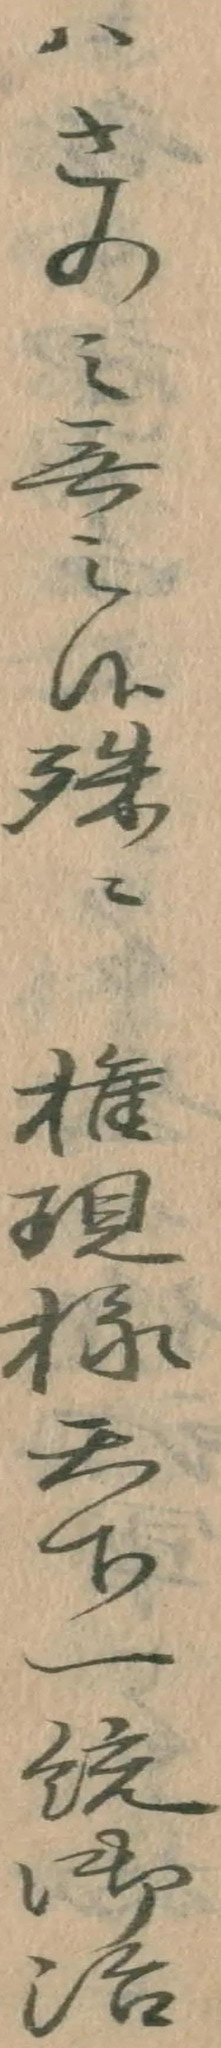はさのみ無之候殊に権現様天下一統御治
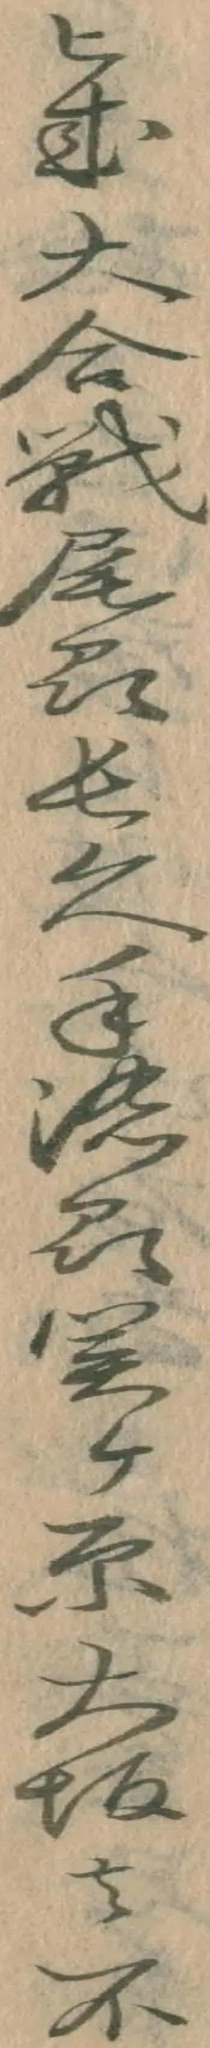被成大合戦尾州長久手濃州関け原大坂者不
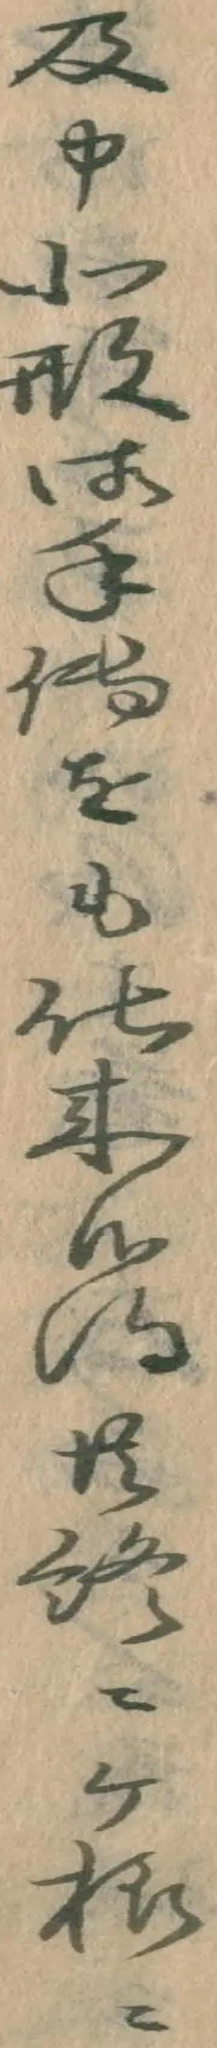及申北形御手伝をも仕来候得共終にけ様に
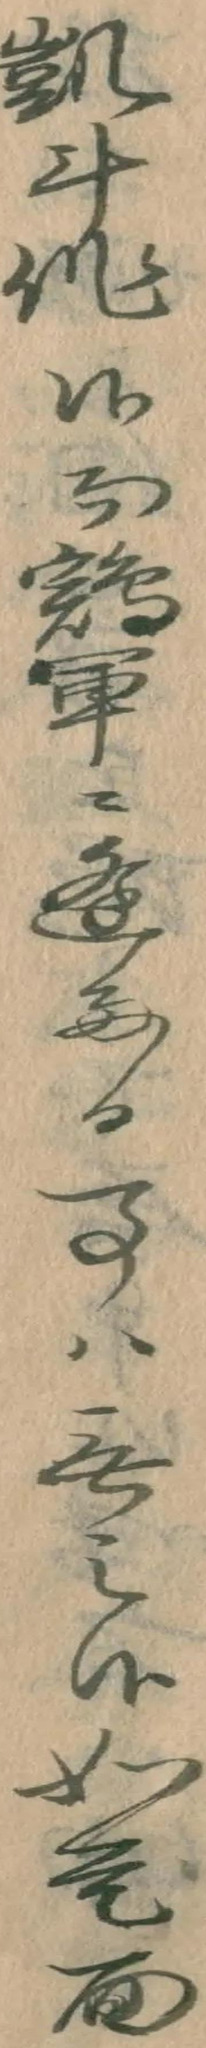凱斗作候而鶏軍に逢多る事は無之候如是面
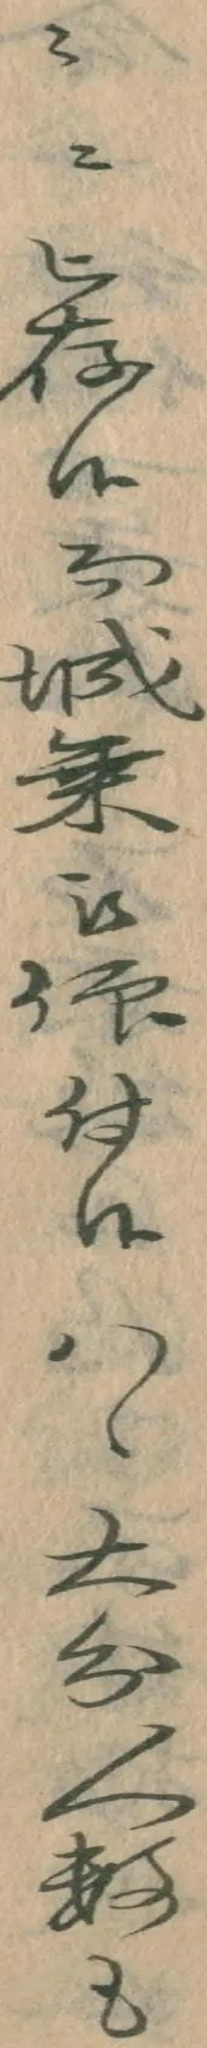々に被存候而城乗被仰付候はゝ大分人数も
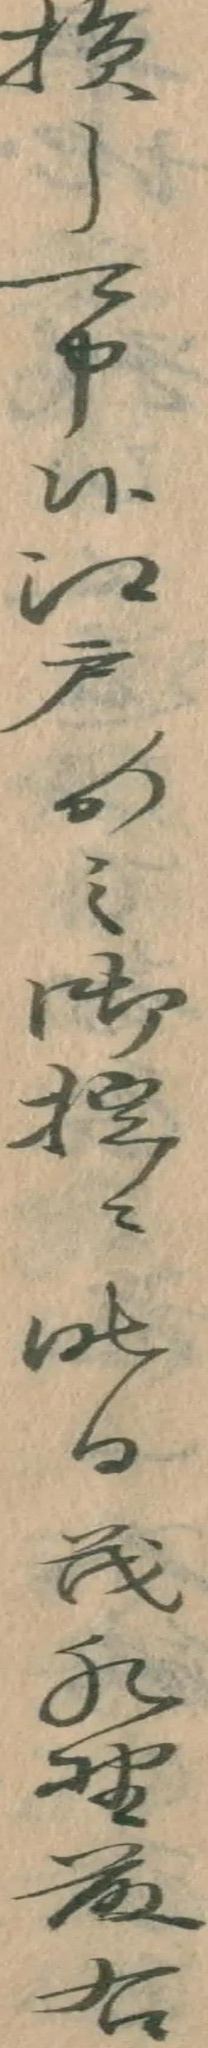損し可申候江戸ゟ之御掟に昨日茂水野藤右
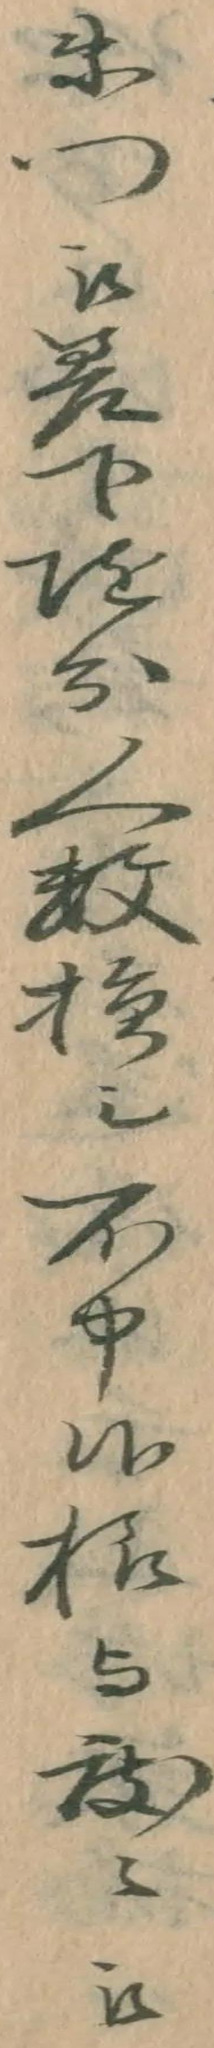衛門被差下随分人数損し不申候様与度々被

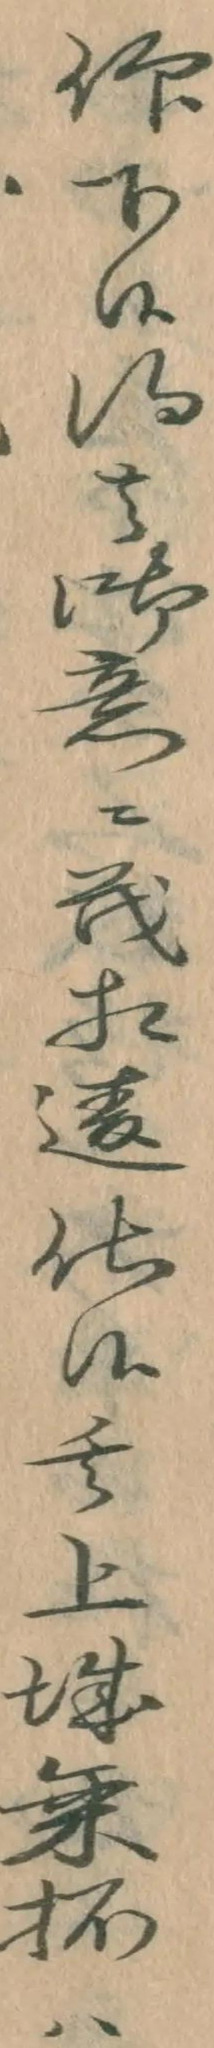仰下候得者御意に茂相違仕候其上城乗抔は
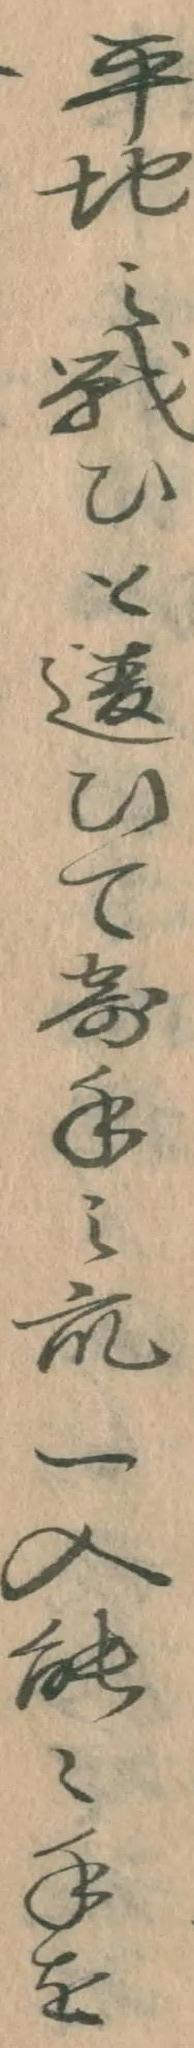平地之戦ひと違ひて寄手之衆一入能々手を
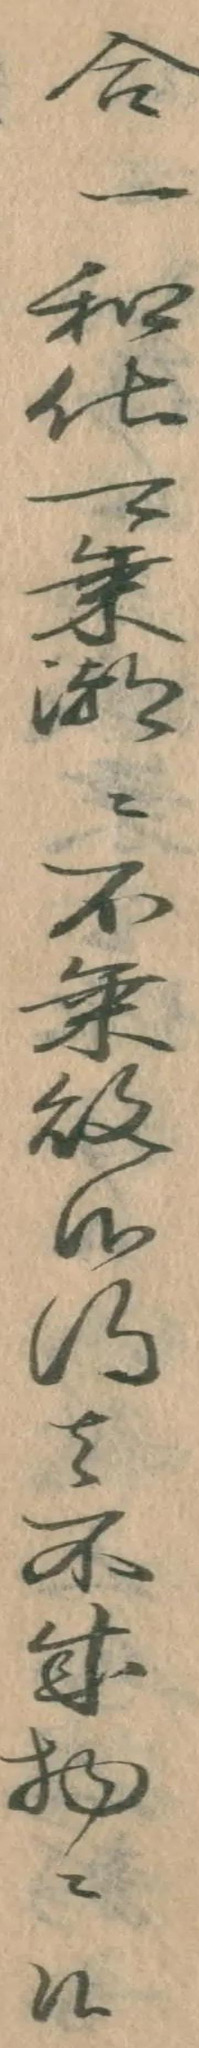合一和仕可乗漸に不乗敗候得者不成物に候
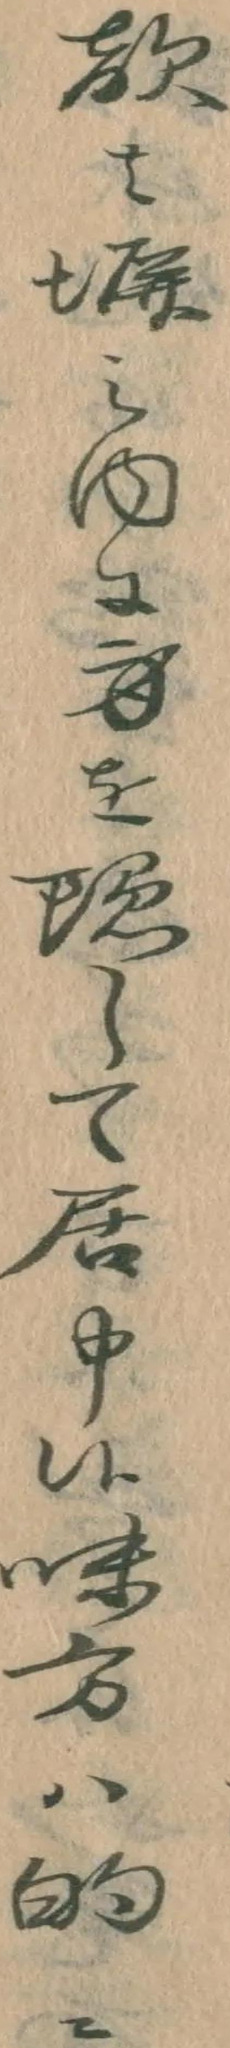敵者塀之内尓身を隠して居申候味方は的に
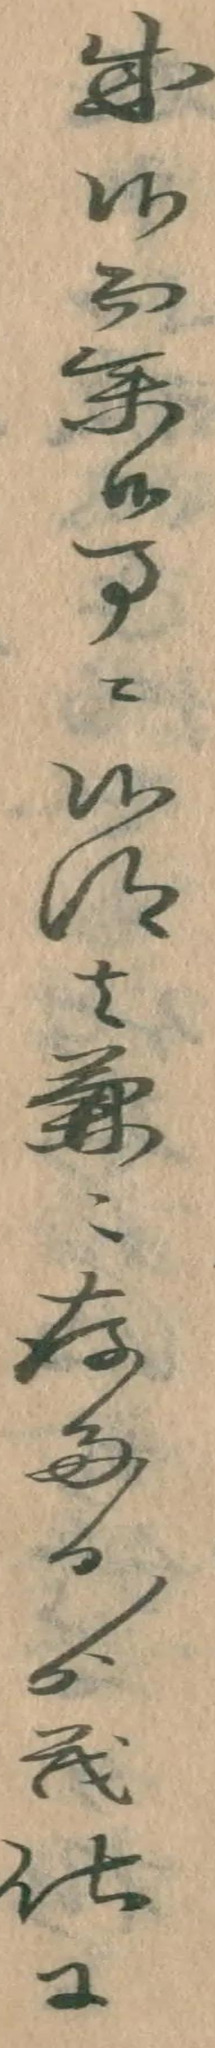成候而参候事に候得者兼々存多るゟ茂仕尓
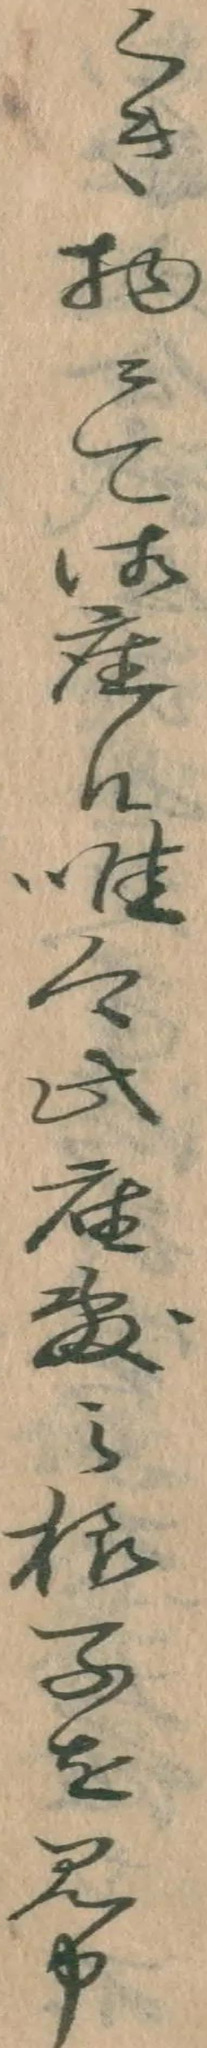くき物にて御座候唯今此座敷之様子を見申
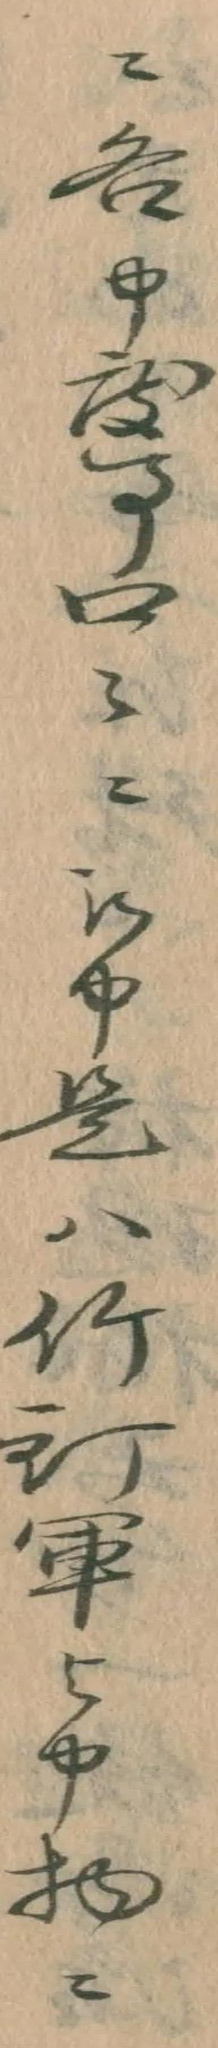に各申度事口々に被申是は竹釘軍与申物に
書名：切支丹御退治記 49巻. [7]
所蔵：国立国会図書館 National Diet Library, JAPAN
